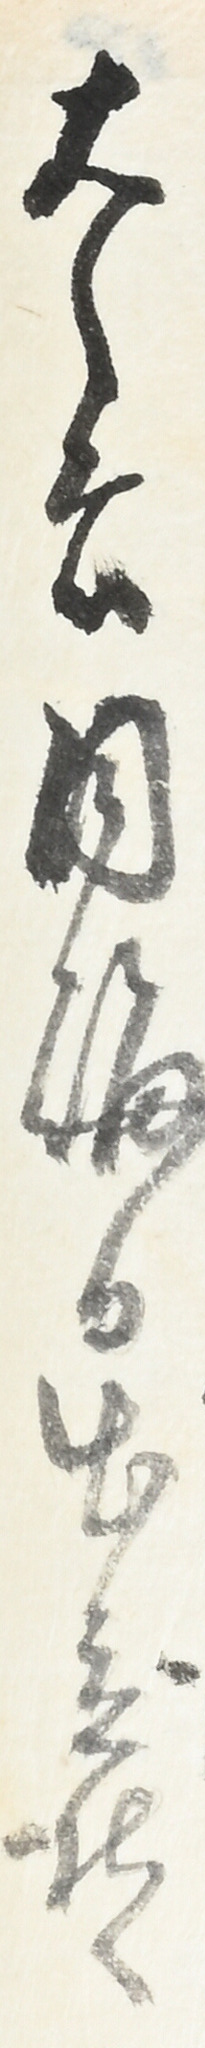右之者同晦日出立仕候

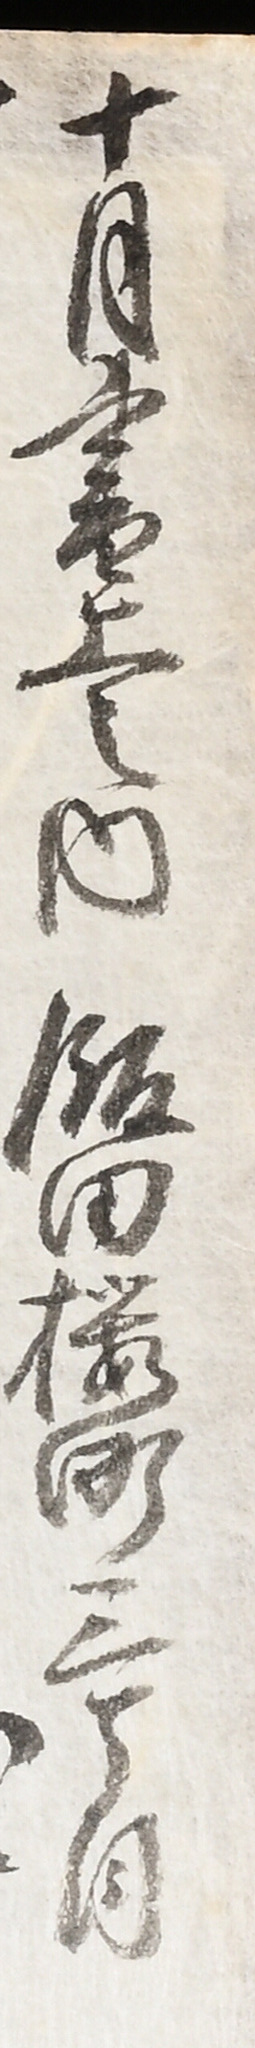十月書上之内飯田桜町三丁目
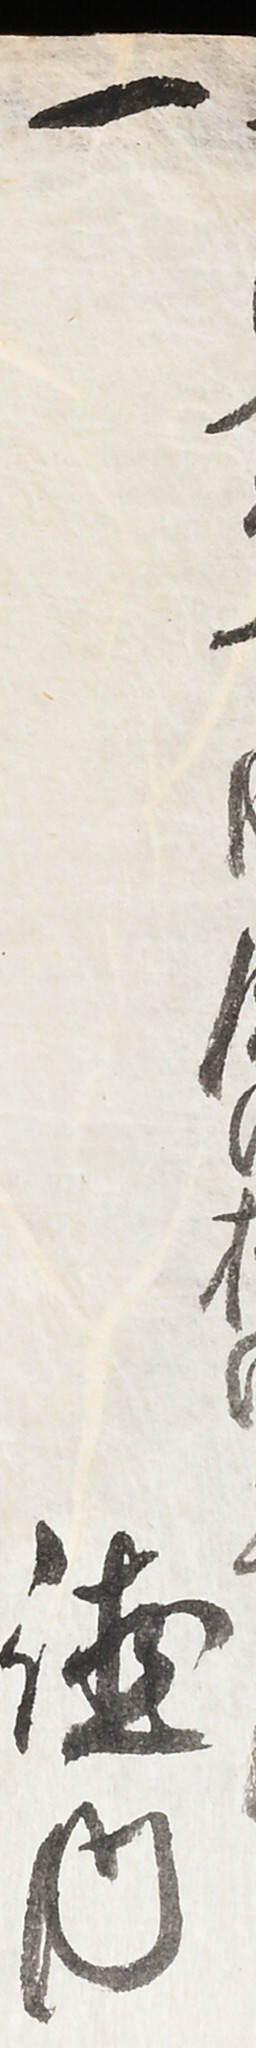一徳内
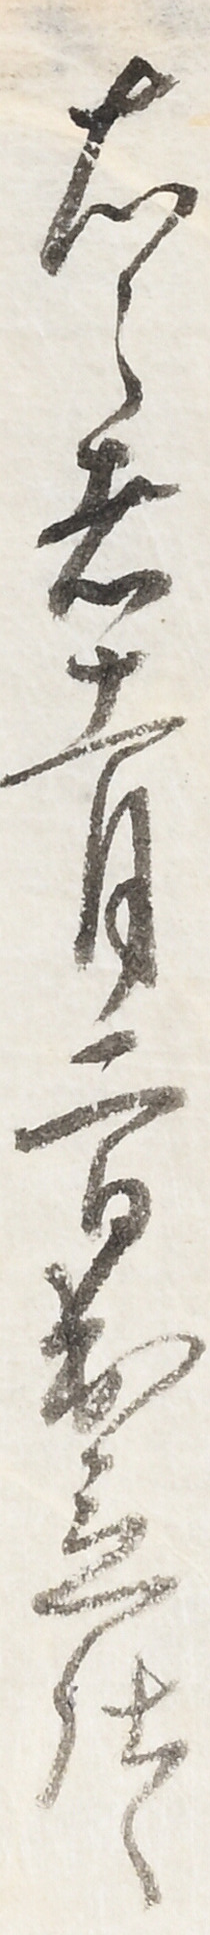右之者十一月二日出立仕候
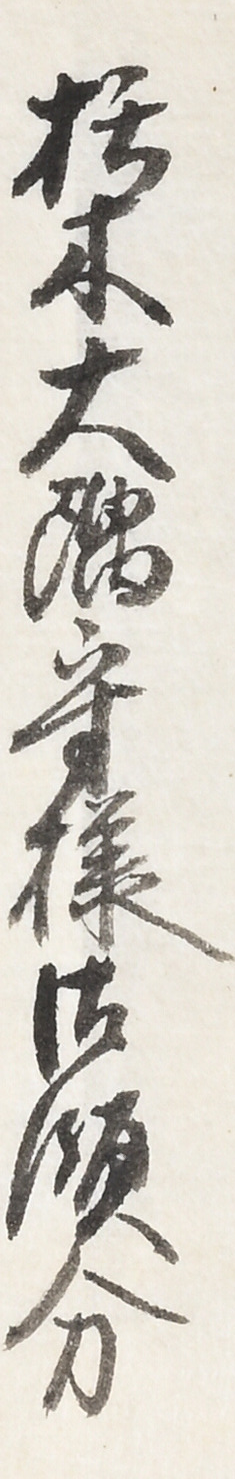朽木大隅守様御領分
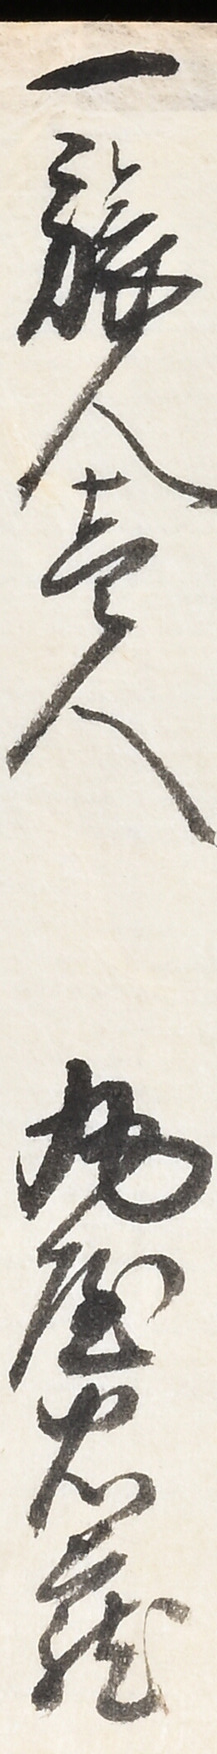一旅人壱人丸尾忠蔵
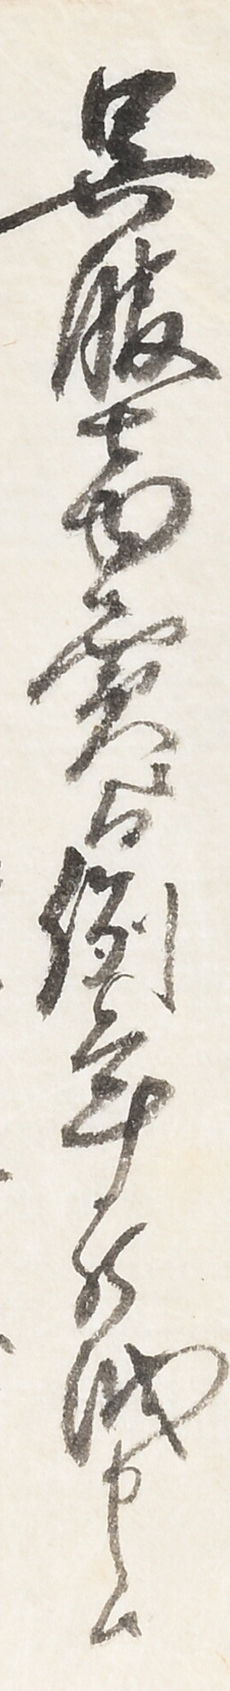呉服商売ニ而例年罷越申候
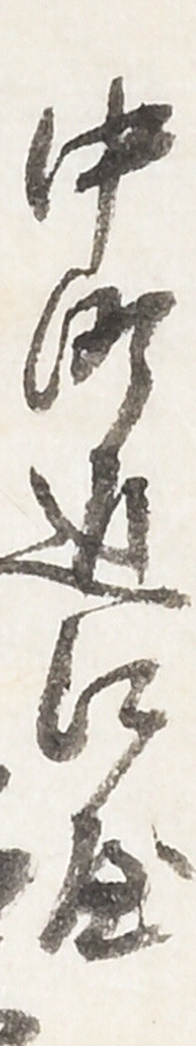中町近江屋
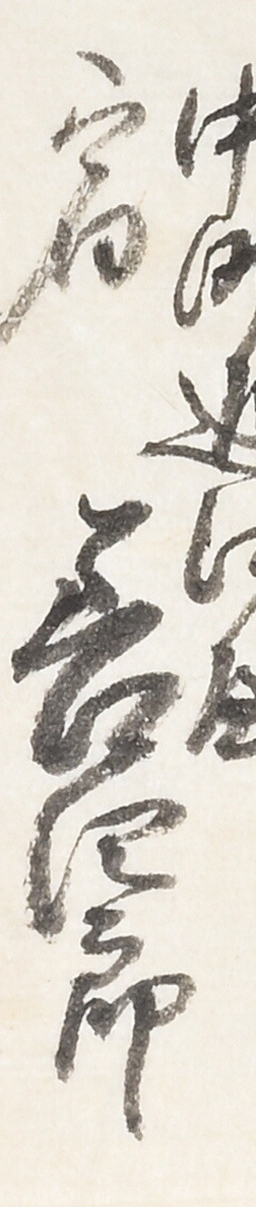宿善四郎
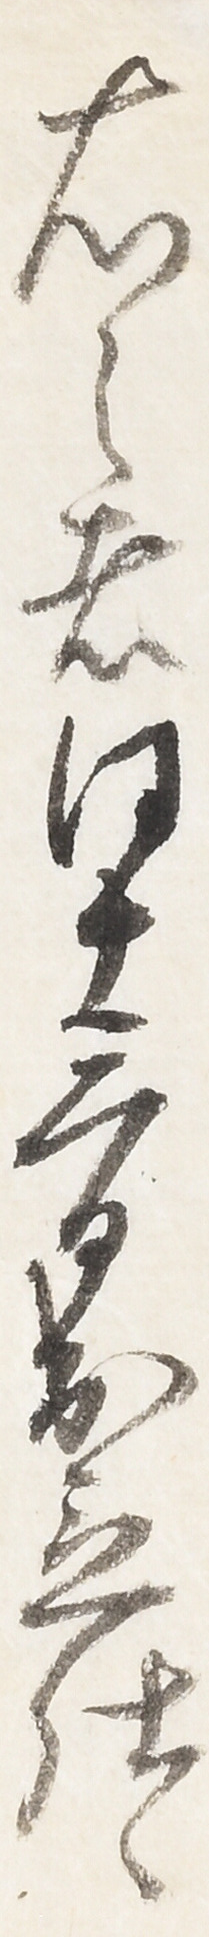右之者同十三日出立仕候
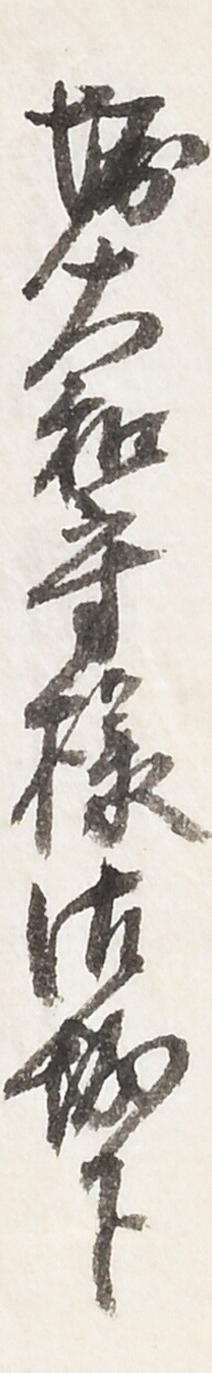堀大和守様御城下
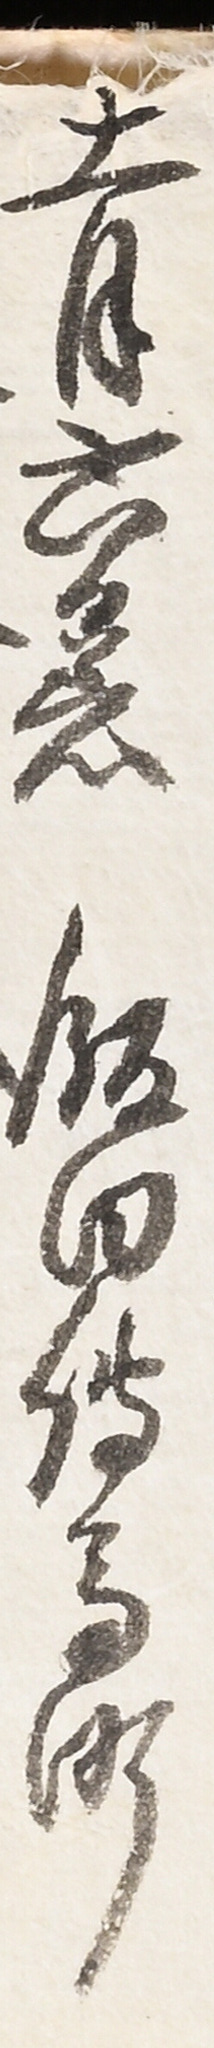十一月六日着飯田伝馬町
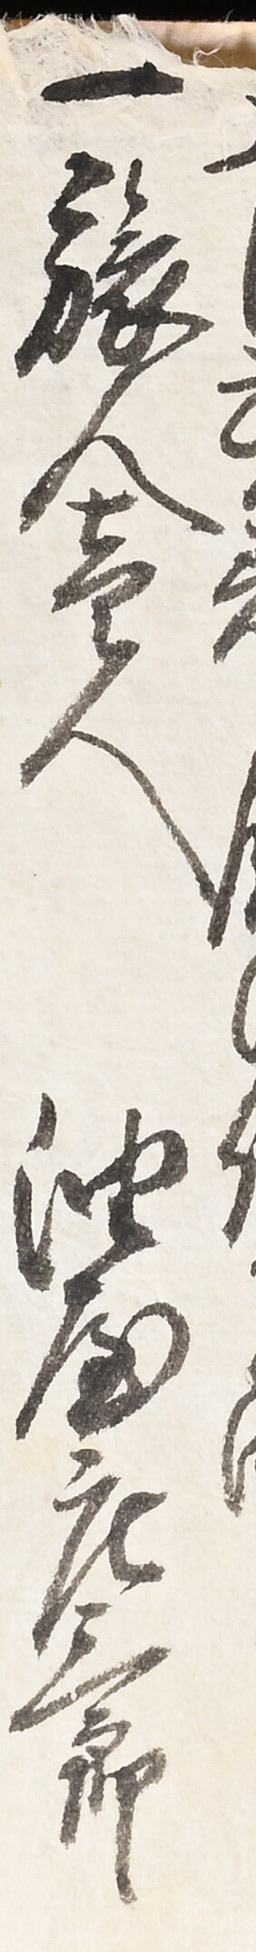一旅人壱人油屋庄三郎
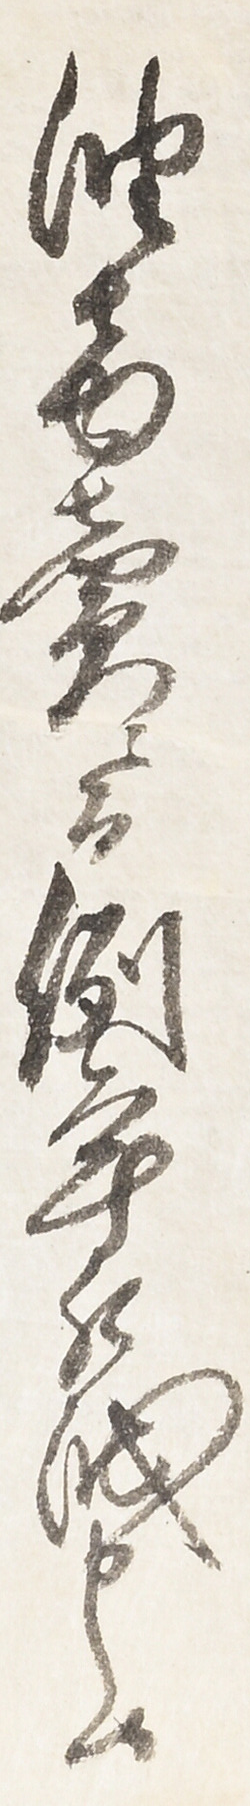油商売ニ而例年罷越申候
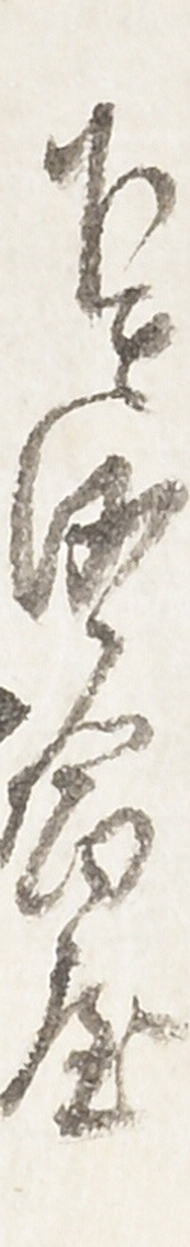下モ町冨屋
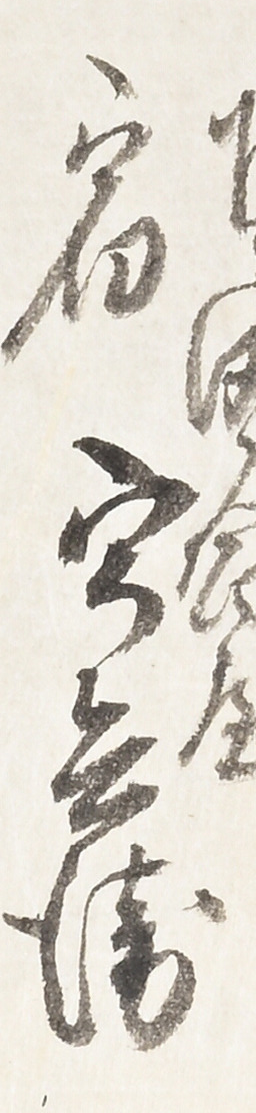宿宇兵衛
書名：旅人泊控帳
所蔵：伊那市立高遠町図書館・合同会社AMANE
